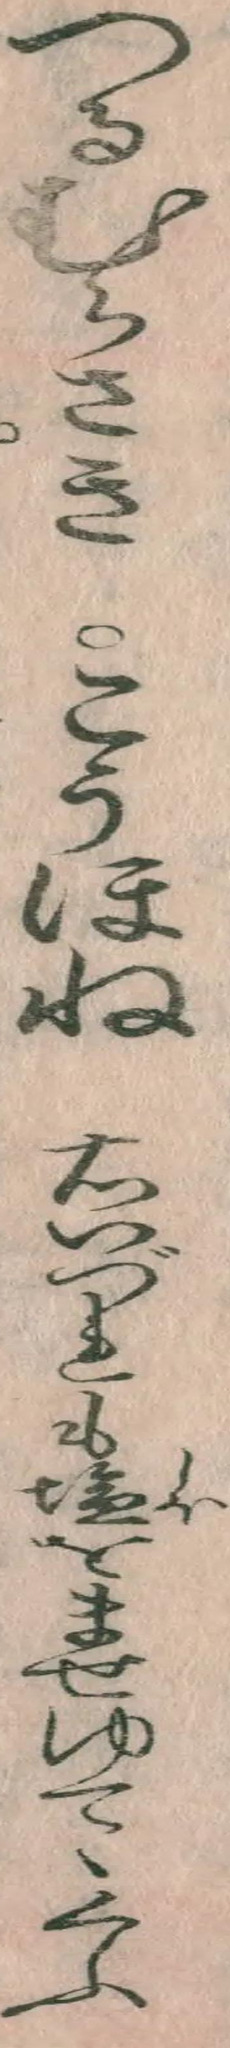つるむらさき◦こうほね右いづれも塩をませゆてゝくふ
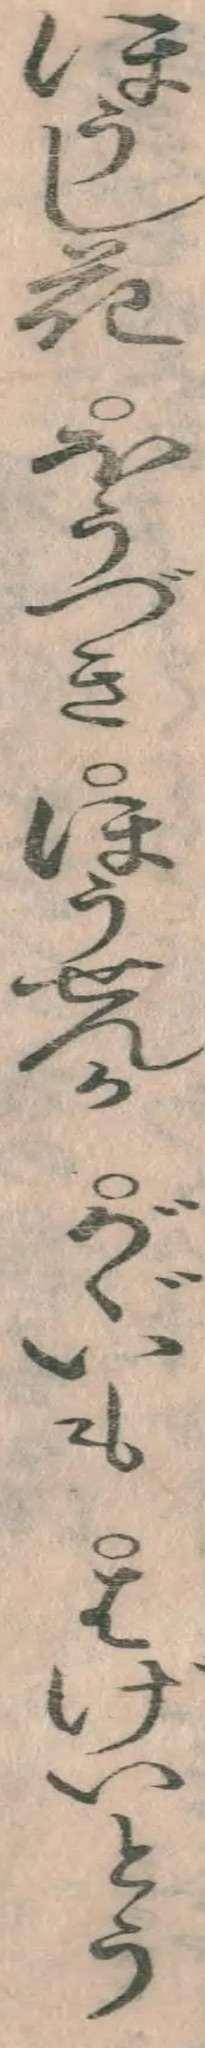ぼうし花◦ほうづき◦ほうせんか◦がゞいも◦はげいとう
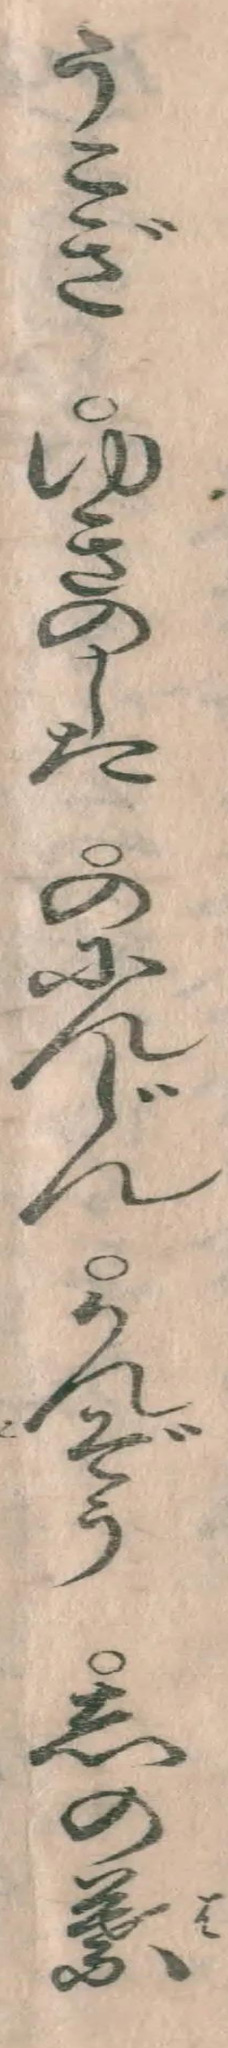うこぎ◦ゆきのした◦のにんじん◦かんぞう◦しの葉

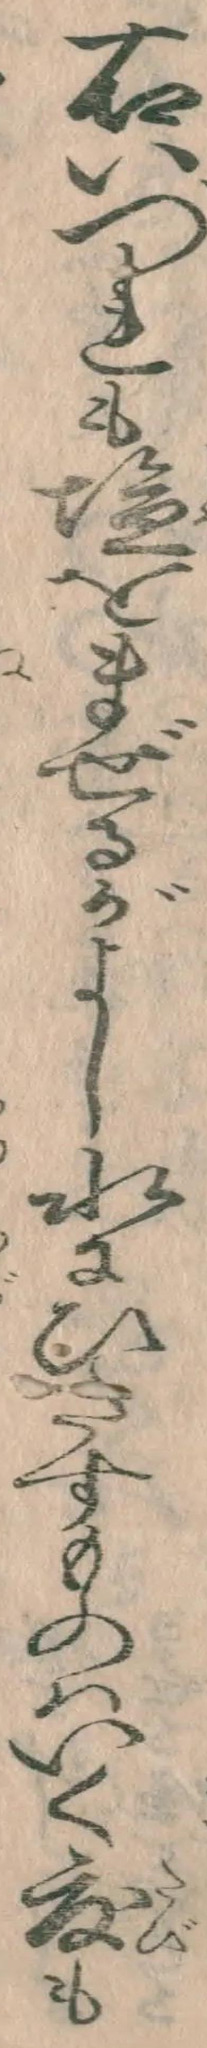右いづれも塩をまぜるがよし水にひたすものはいく度も
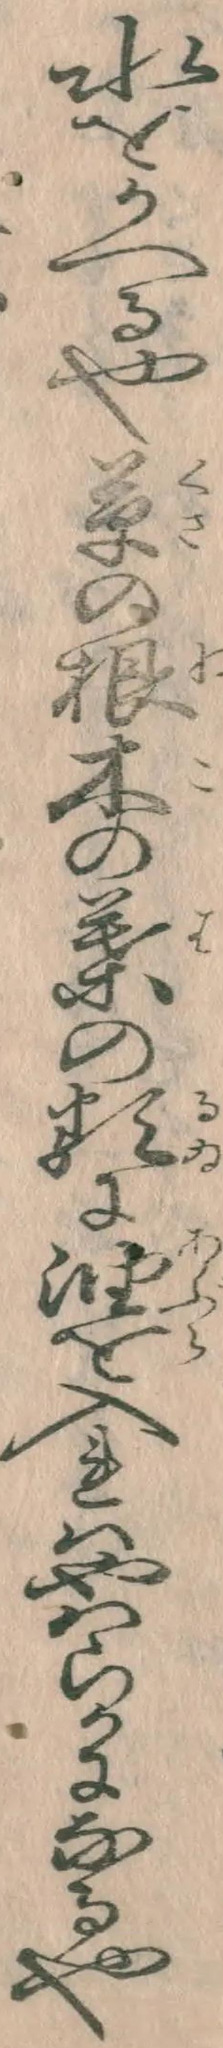水をかへる也草の根木の葉の類に油を入れはやはらかになる也
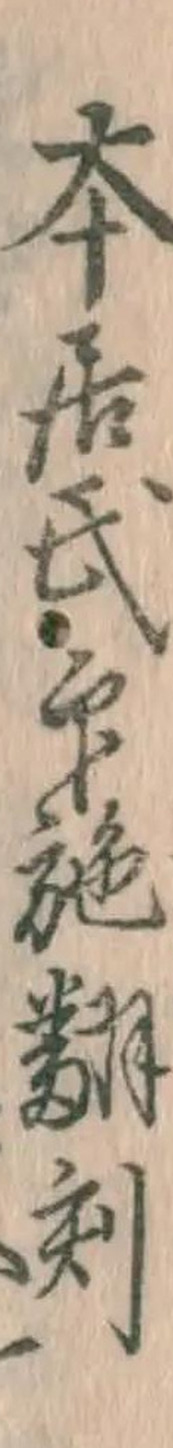本居氏印施翻刻
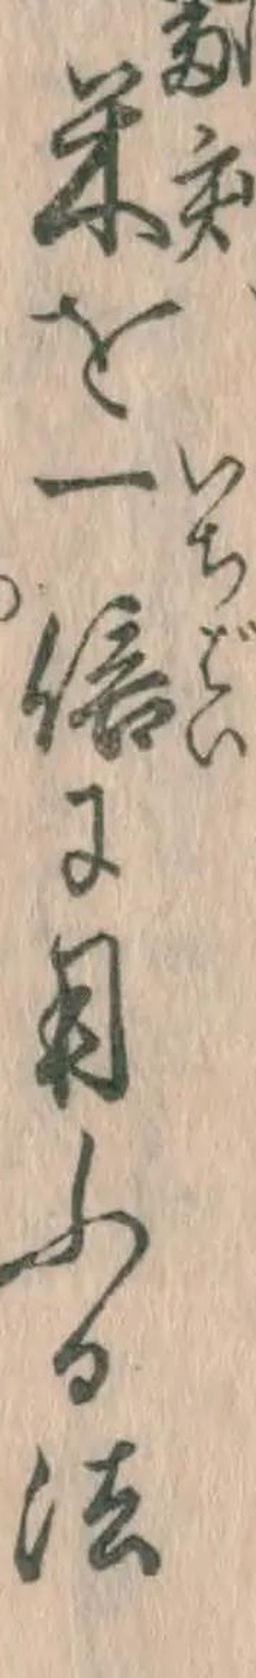米を一倍に用ふる法
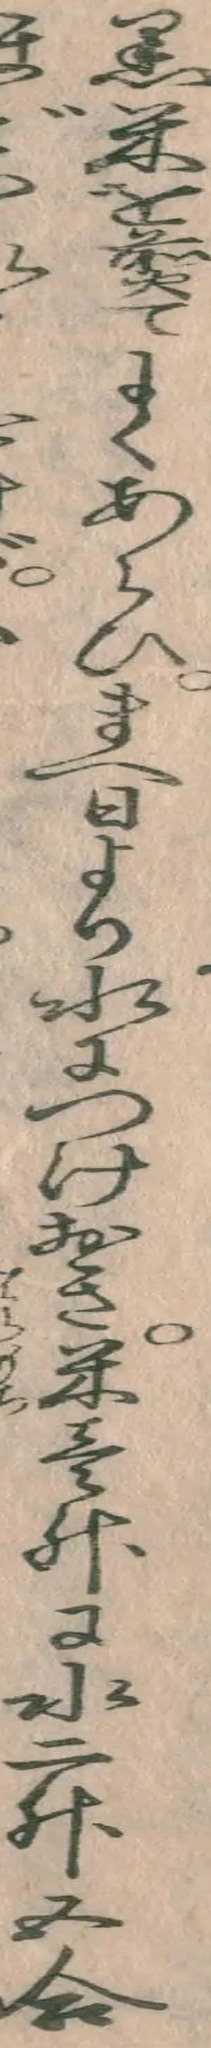黒米を煎てよくあらひ。まへ日より水につけおき。米壱升に水二升五合
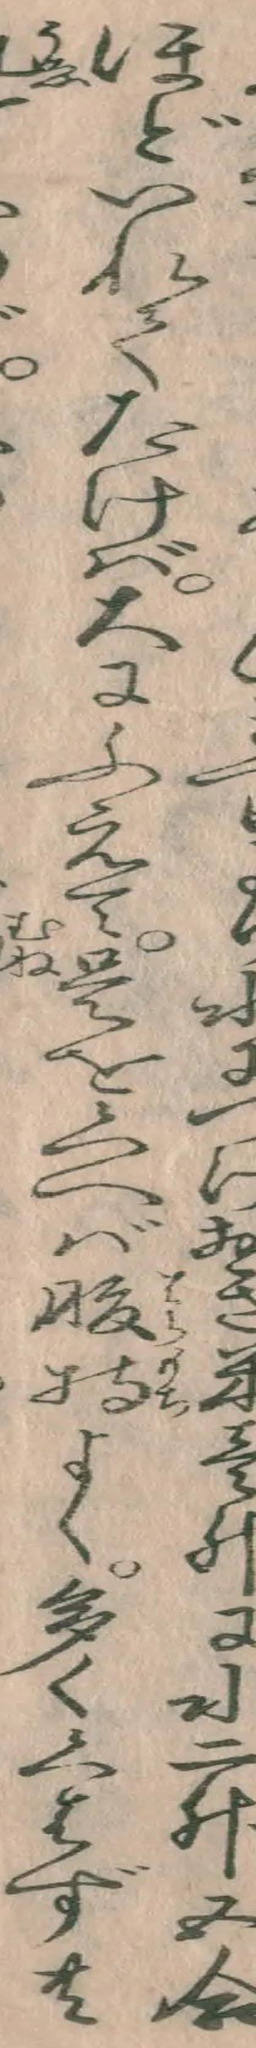ほどいれてたけば。大にふえて。是をくへば腹持よく。多くくはず共
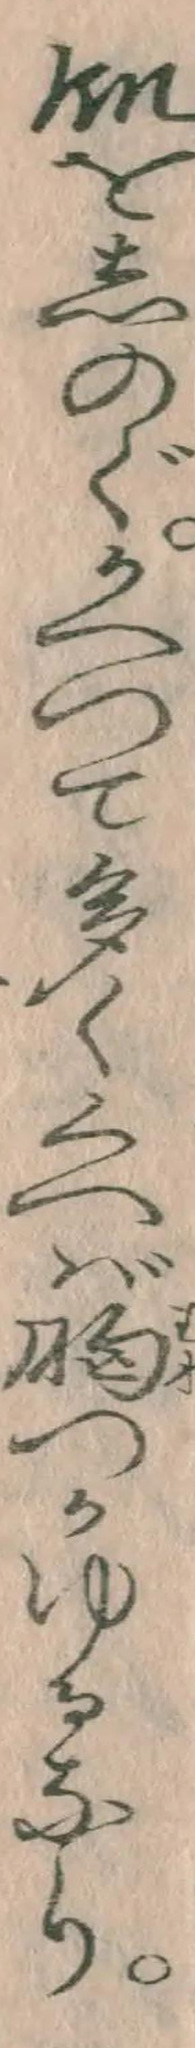飢をしのぐ。かへつて多くくへば胸つかゆるなり。
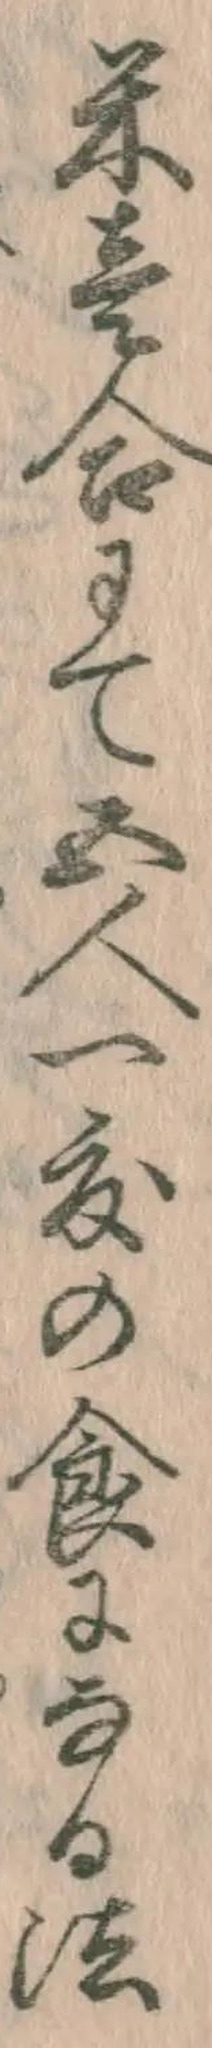米壱一合にて五人一度の食になる法
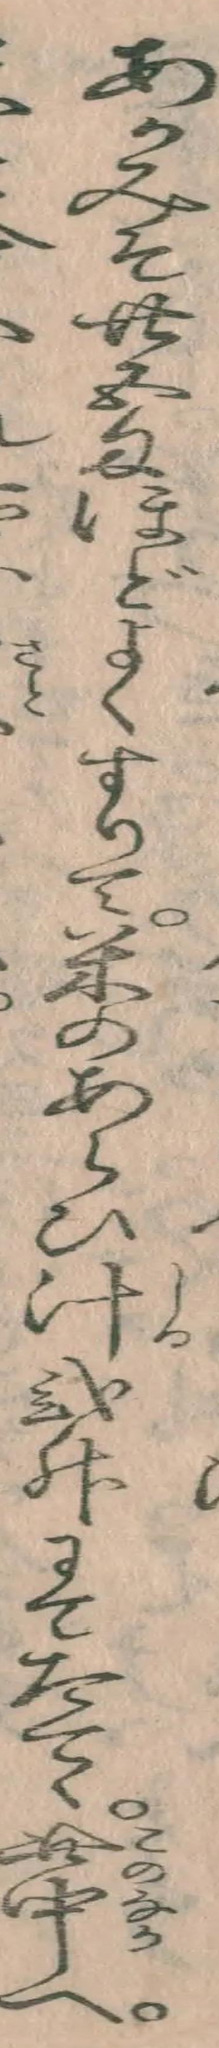あかみそ廿五匁ほどよくすりて。米のあらひ汁弐升にてたてゝ。此中へ。
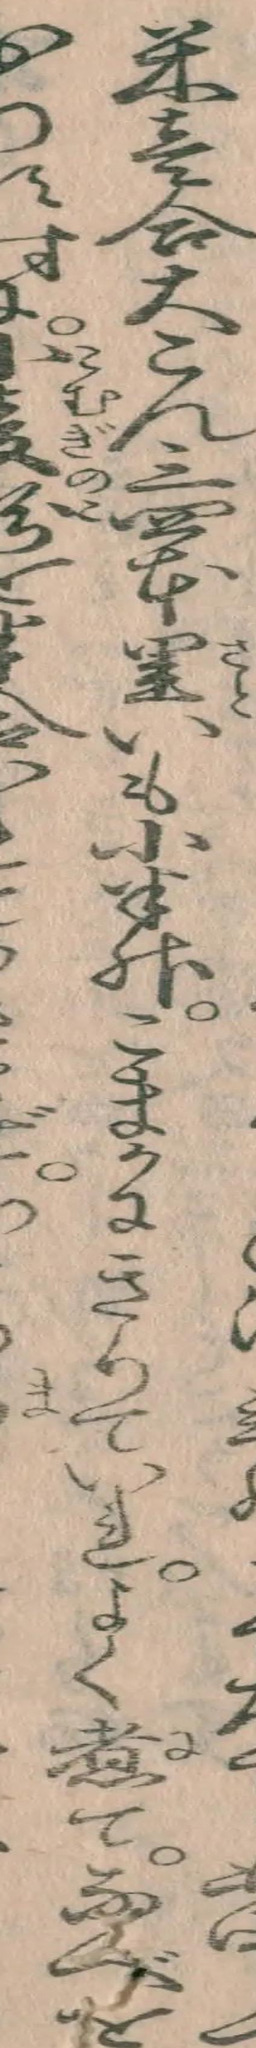米壱合大こん三四本里いも小半升。こまかにきりていれ。よく煮て。なべを
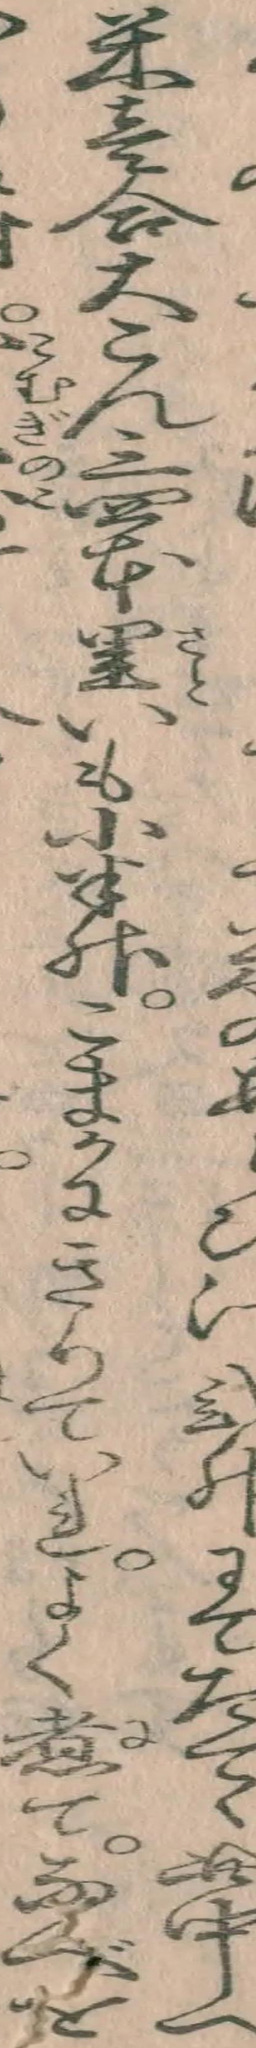米壱合大こん三四本里いも小半升。こまかにきりていれ。よく煮て。なべを
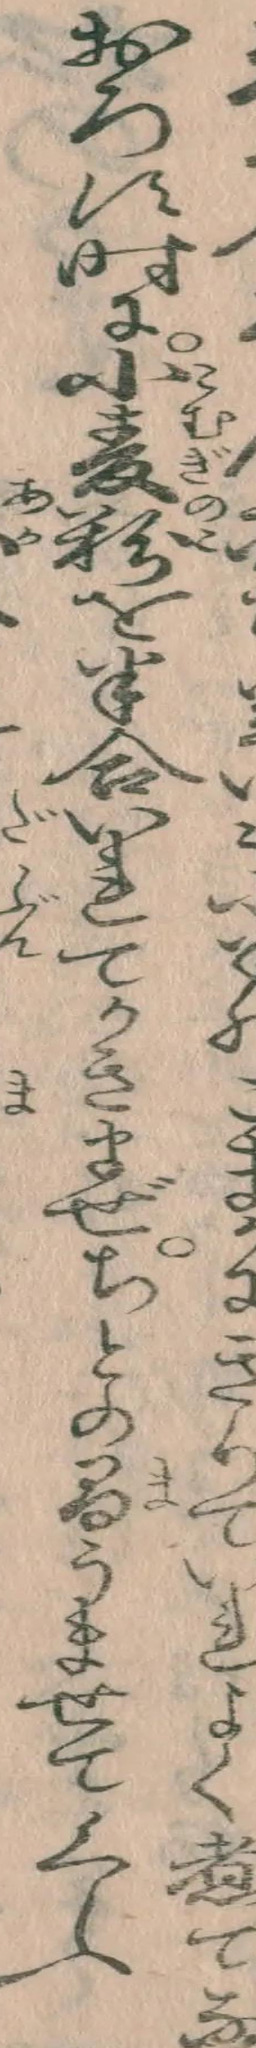おろす時に。小麦粉を半合いれてかきまぜ。ちとの間うませてくふ
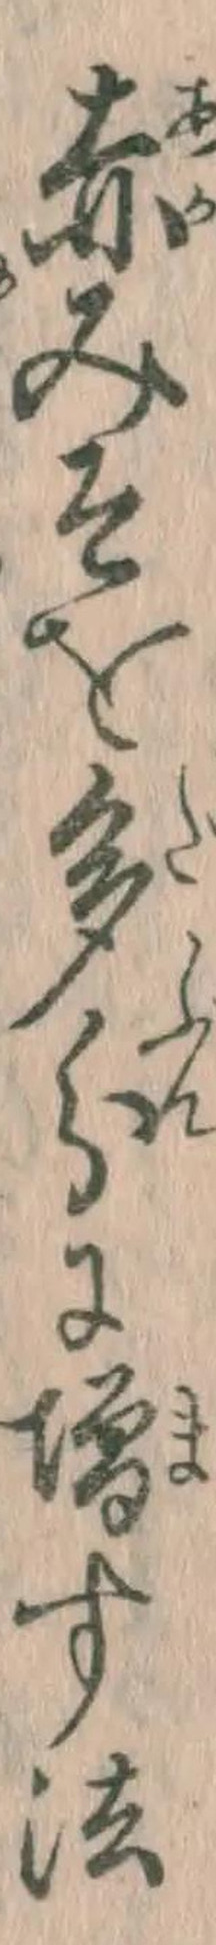赤みそを多分に増す法
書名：きゝん年の食物
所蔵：国立国会図書館 National Diet Library, JAPAN
